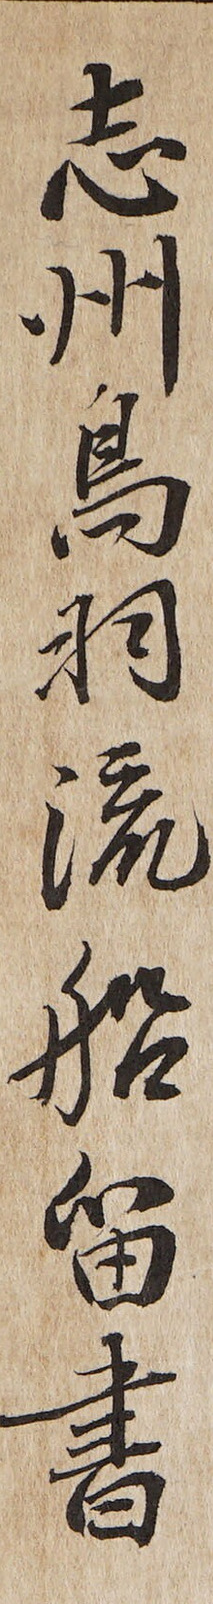志州鳥羽流船留書

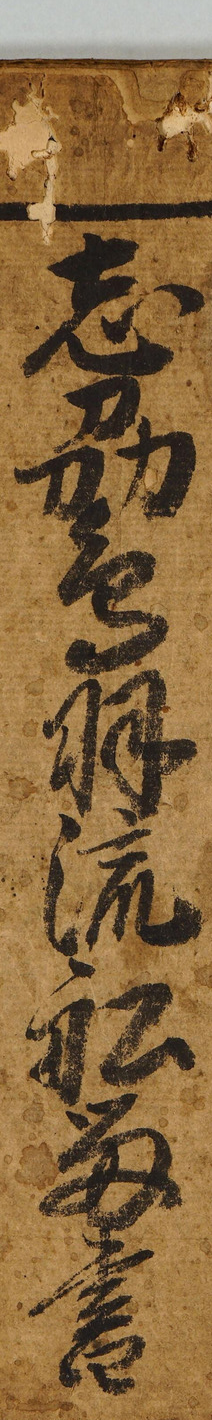志州鳥羽流船留書
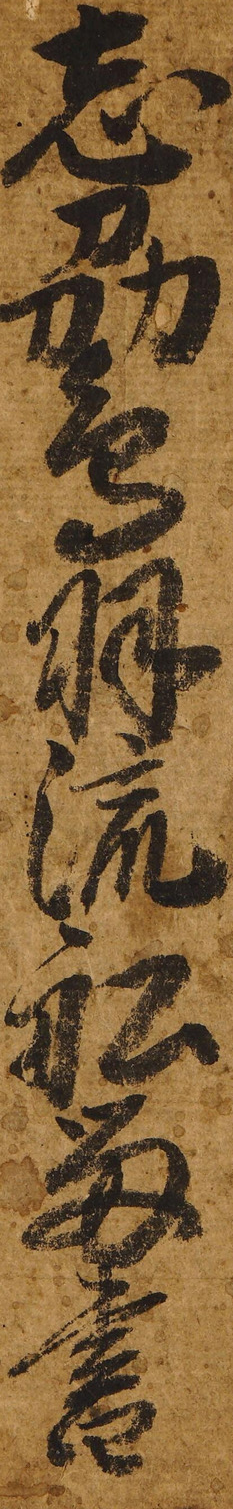志州鳥羽流船留書

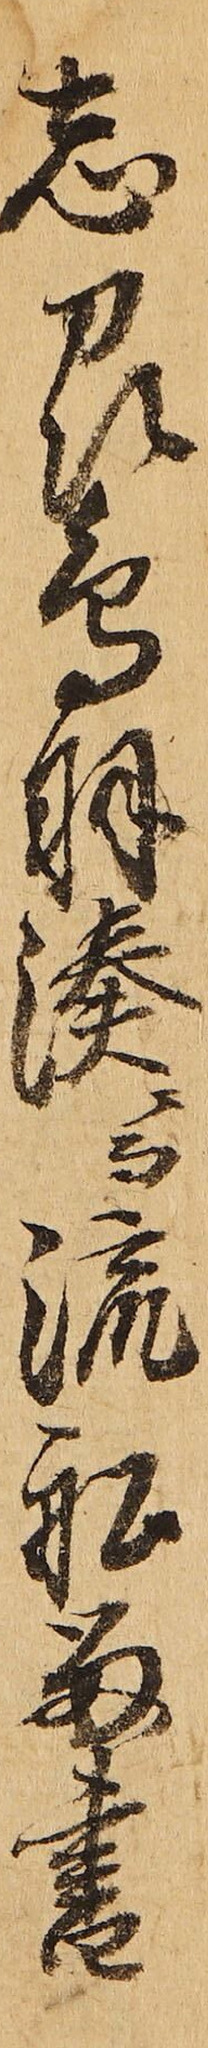志州鳥羽湊にて流船留書
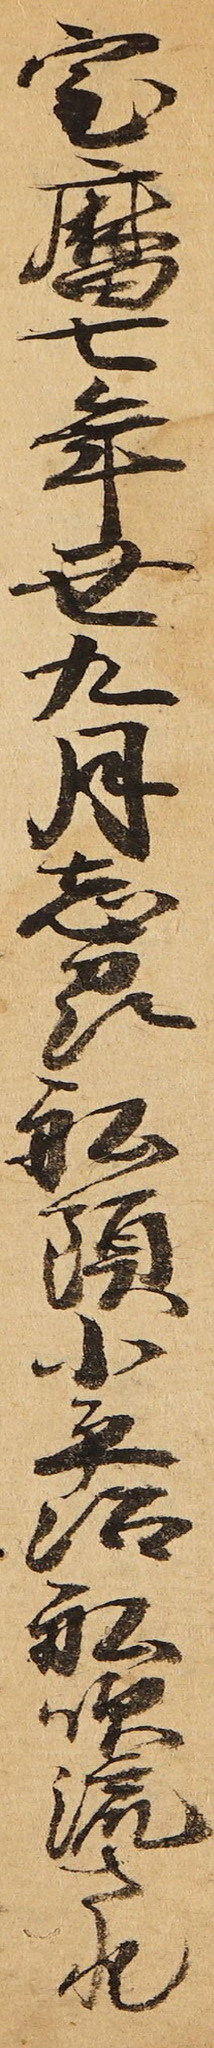宝暦七年丑九月志州船頭小平治船吹流され
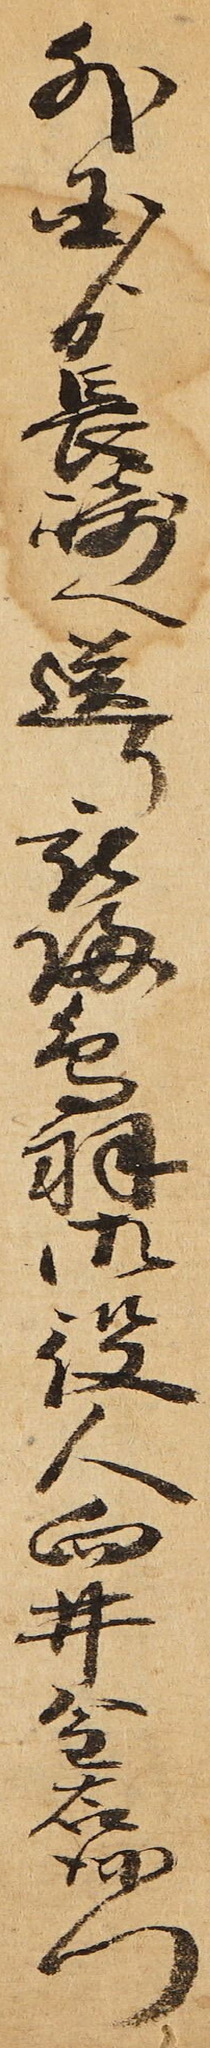外国ゟ長崎へ送り被帰鳥羽御役人向井金右衛門
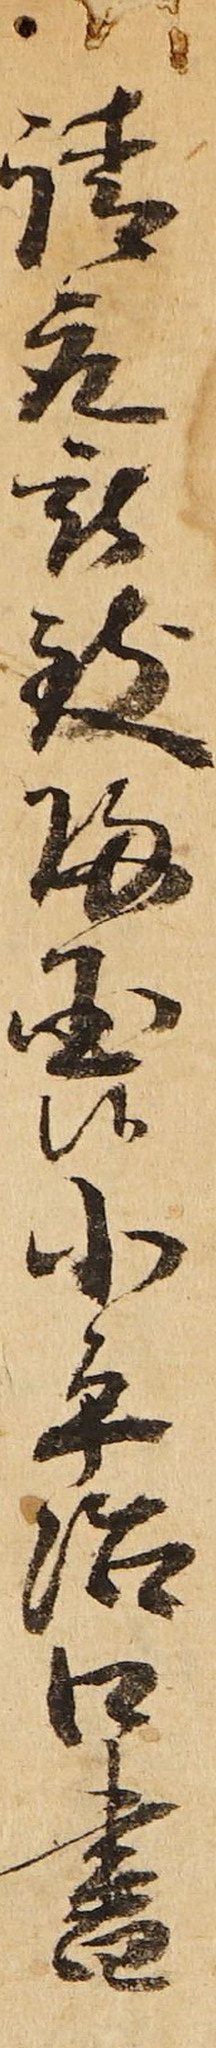請取被致帰国候小平治口書
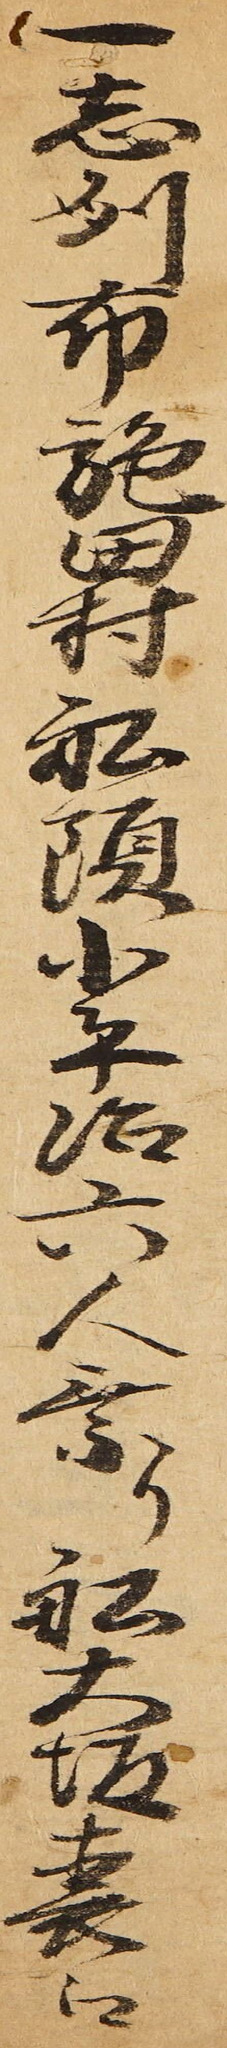一志州布施田村船頭小平治六人乗り船大坂表え
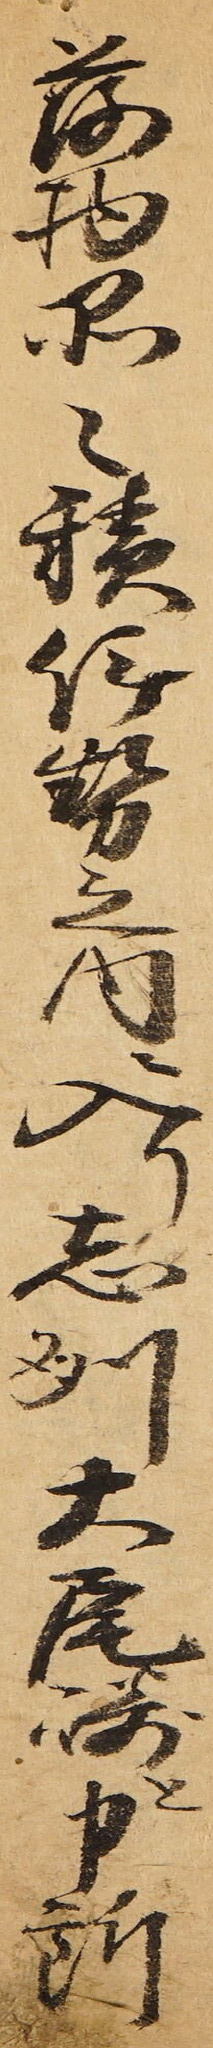荷物品々積伊勢之内に入り志州大尾崎と申所
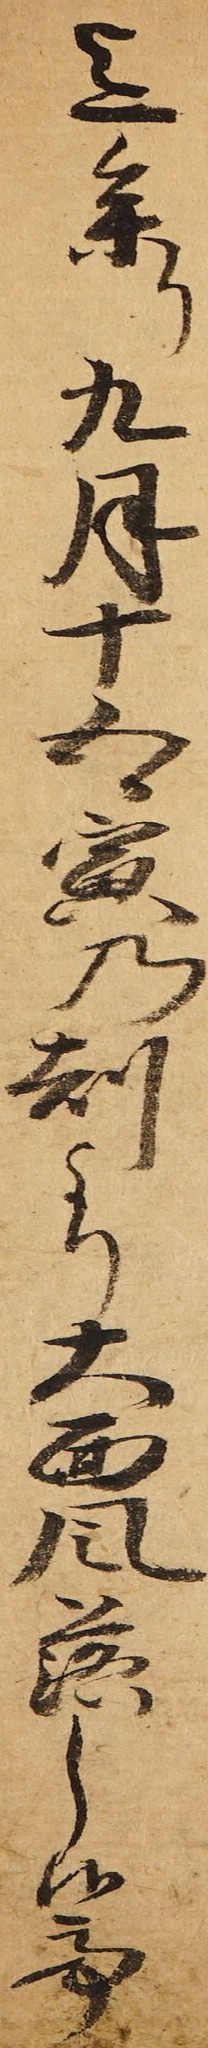迄参り九月十五日寅の刻より大雨風落し候て
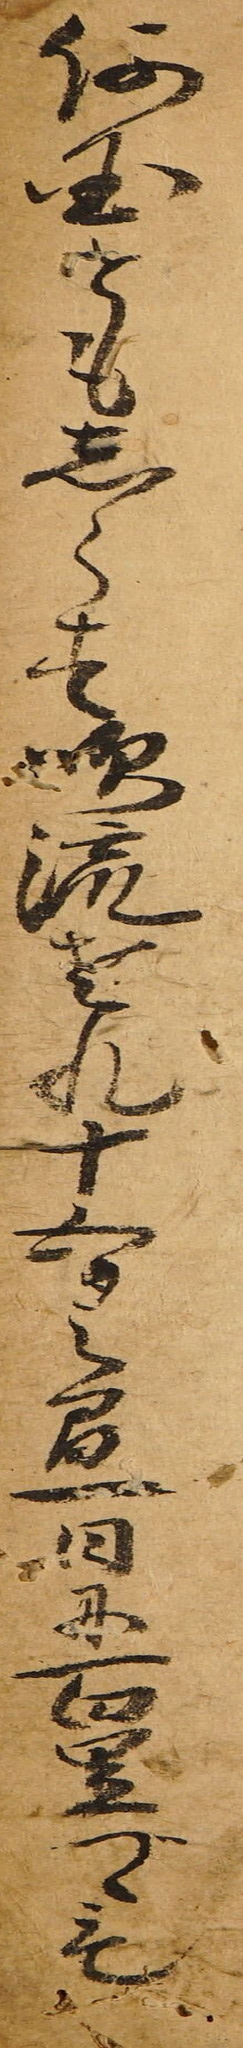何国ともしらす吹流され十五日之間一日に百里づゝも

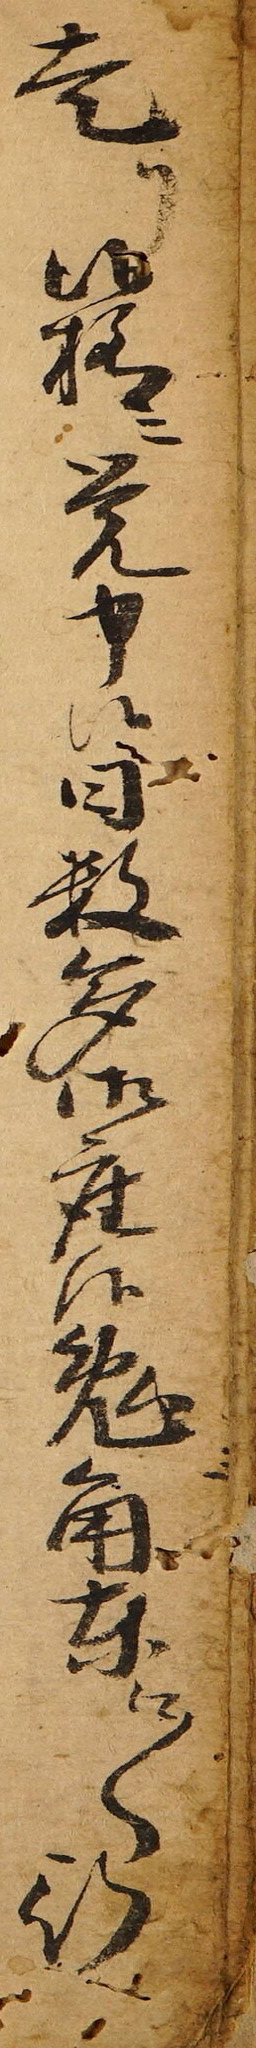走り候様に覚申候日数多御座候兎角東え〳〵行
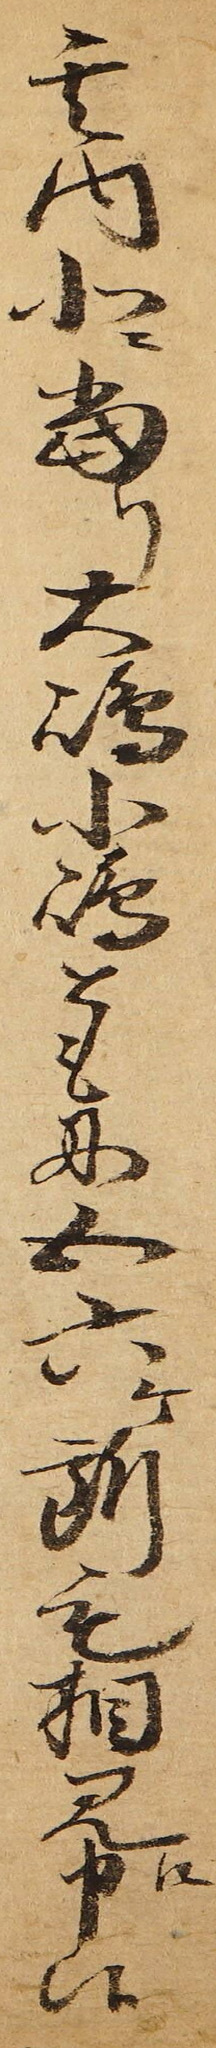其内北に当り大島小島ともに五六ヶ所も相見え申候
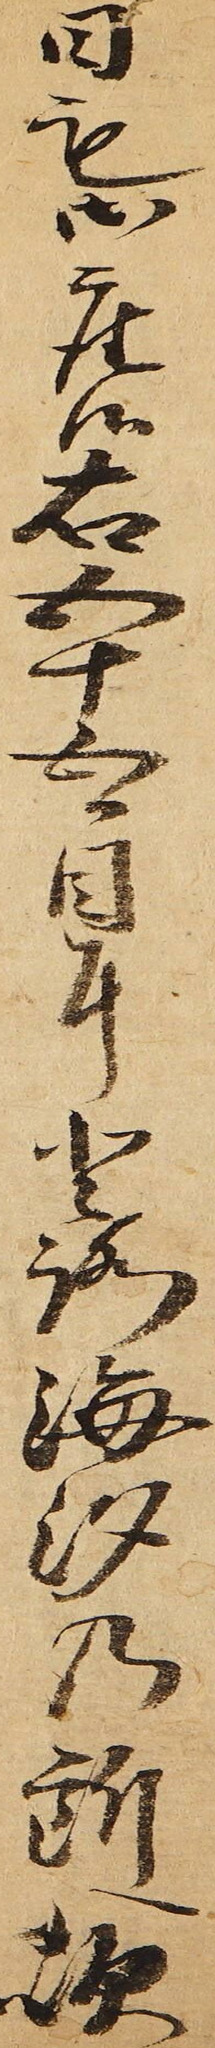日も御座候右五十五日目にとろ海汐の所へ吹
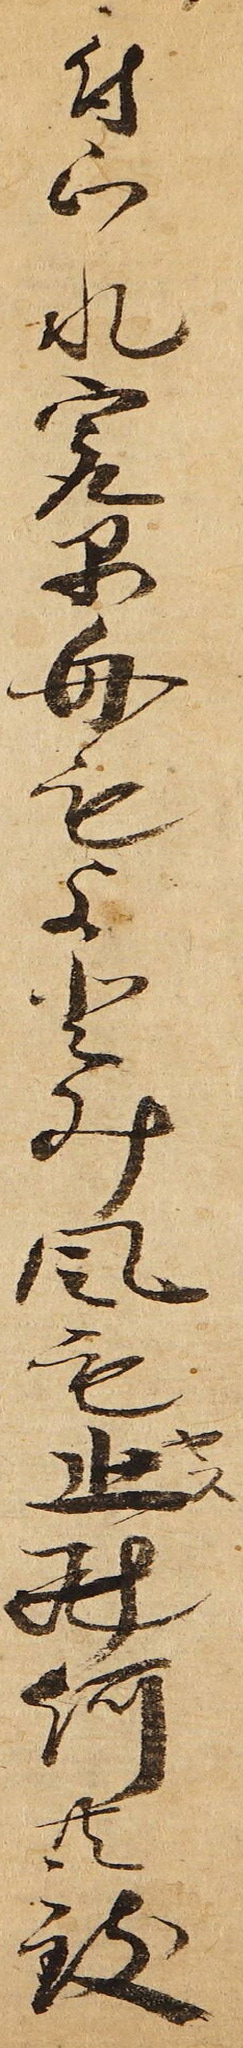付られ最早舟もよとみ風も止み何共致
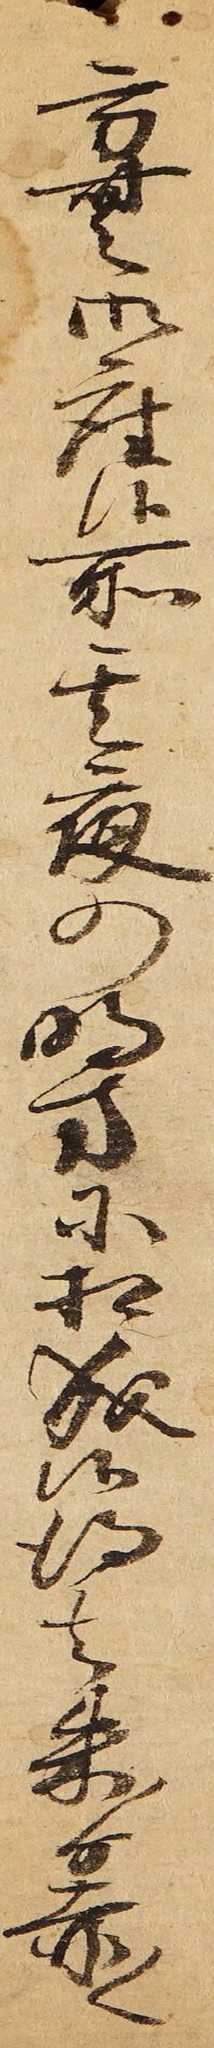方無之御座候所其夜の明方に相成候得は朱ゟ赤く
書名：志州鳥羽流船留書
